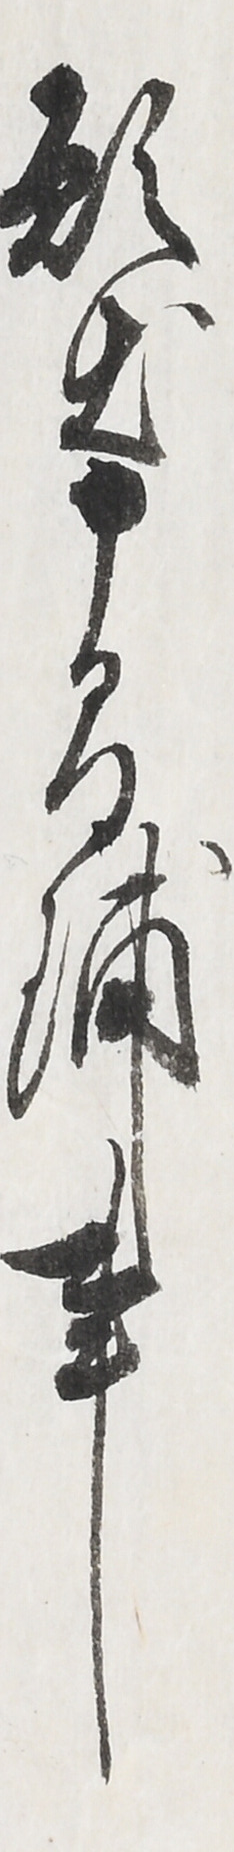願出申間敷事
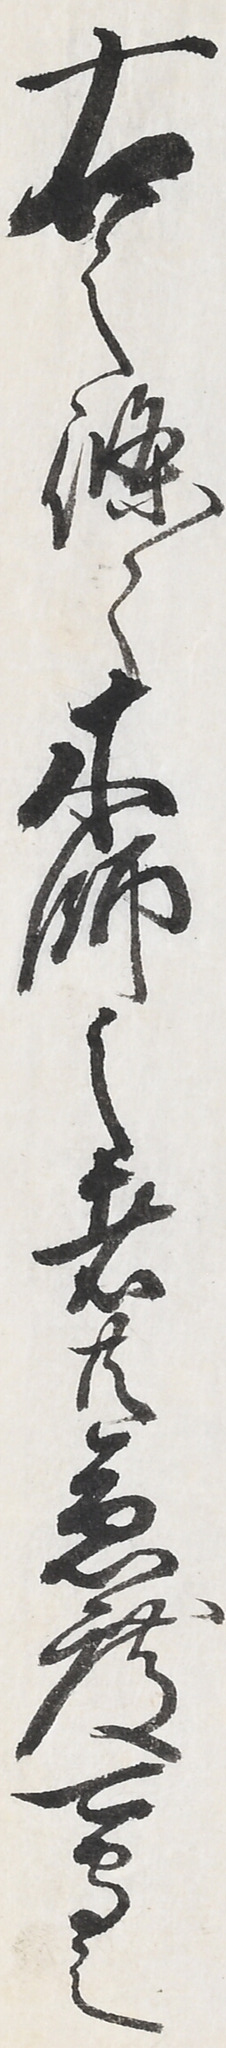右之條々木師之者共急度可守之
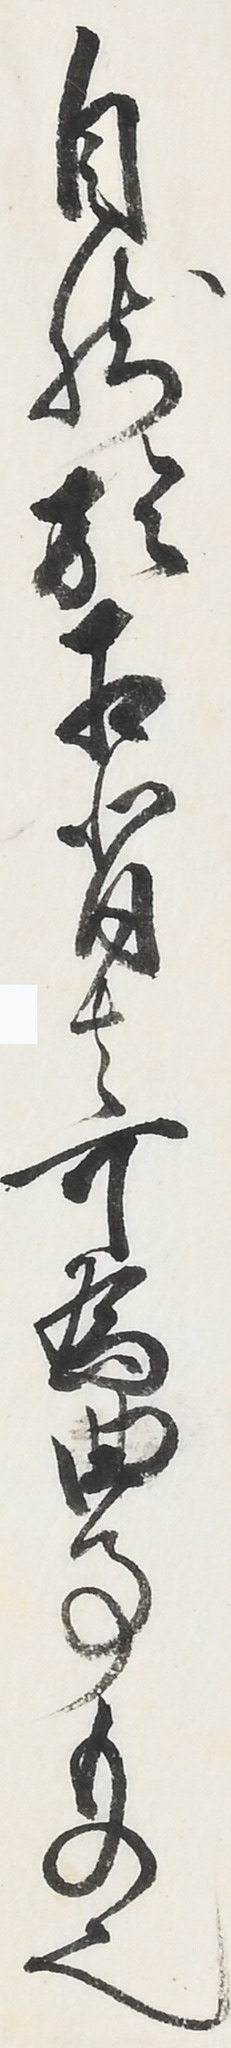自然於相背者可為曲事もの也
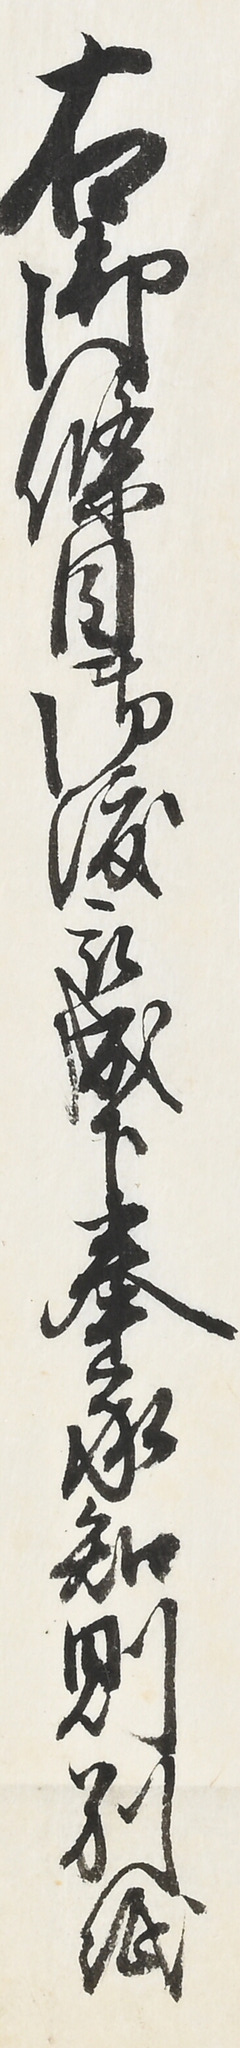右御條目御渡被成下奉承知則別紙
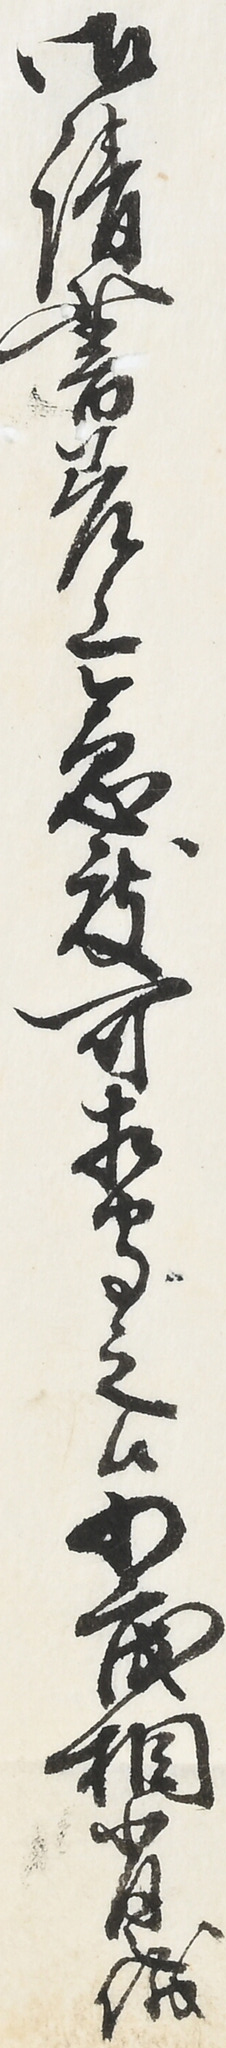請書差上急度可相守之候少茂相背儀

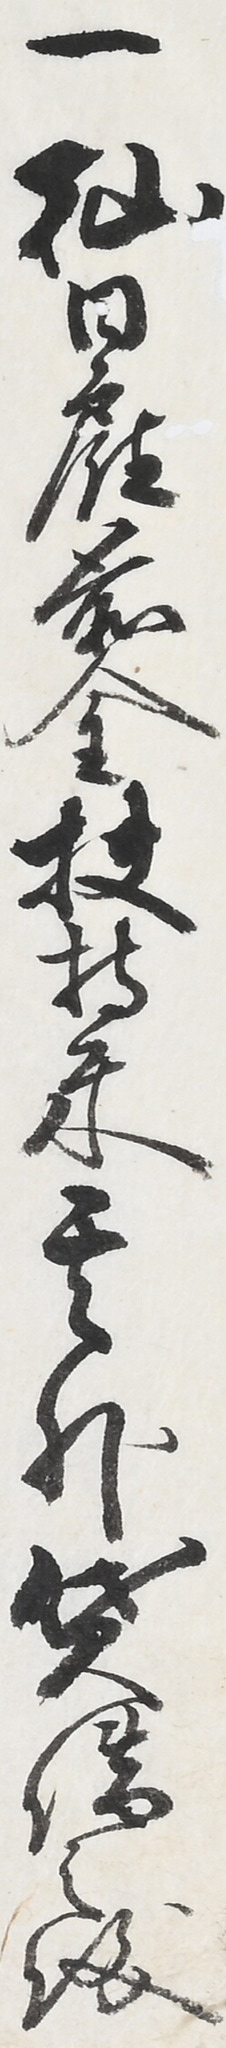一杣日雇前金扶持米其外貸借之儀
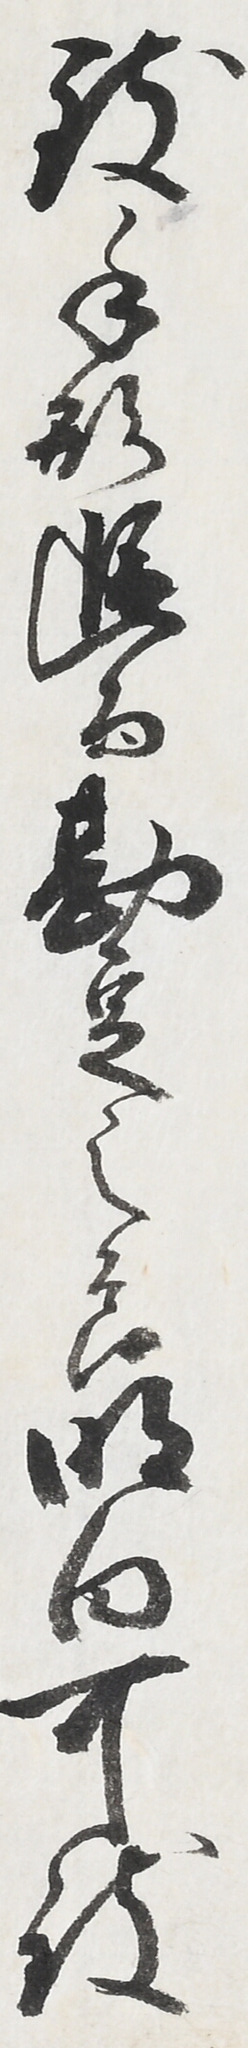致手形追而勘定之節明白可致
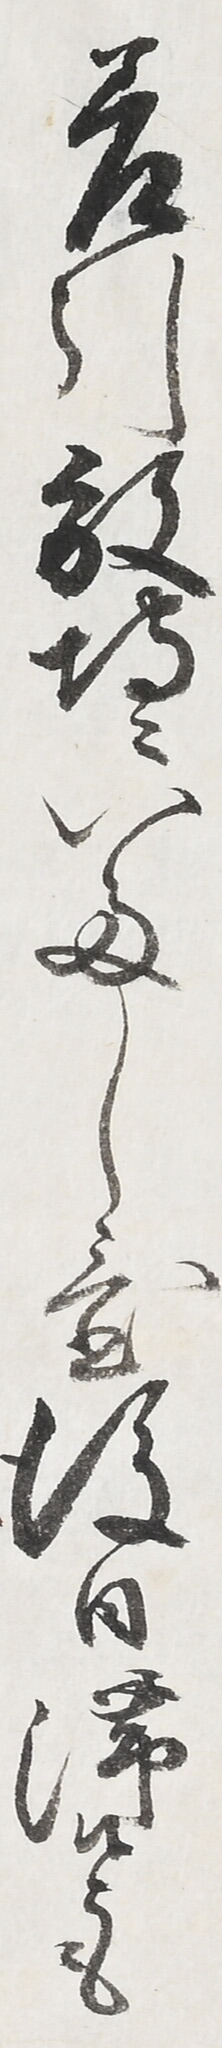差引放埒ニいたし置後日滞候とも
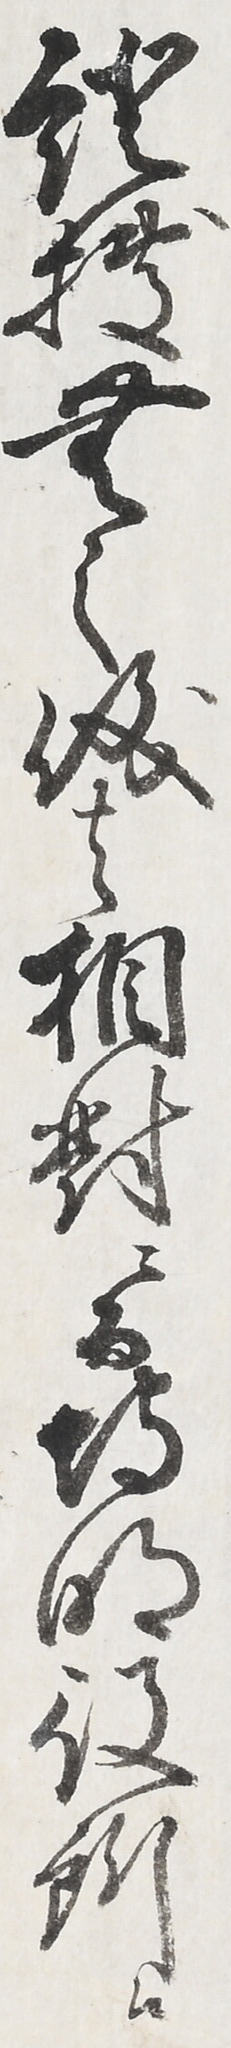証拠無之儀者相対ニ而埒明役所江
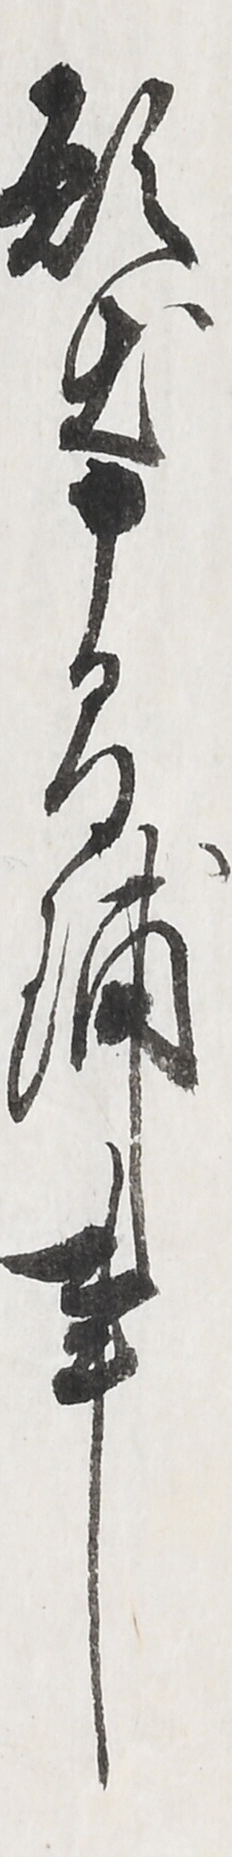願出申間敷事
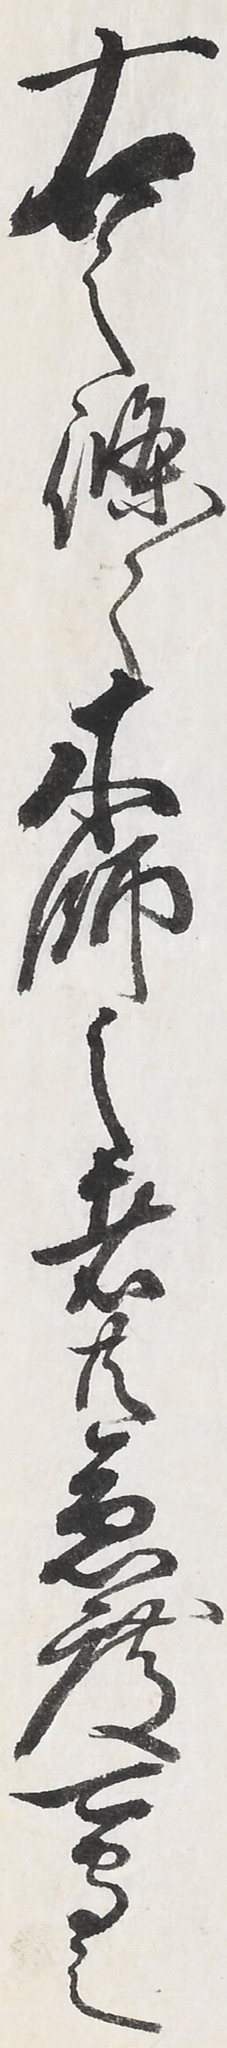右之條々木師之者共急度可守之
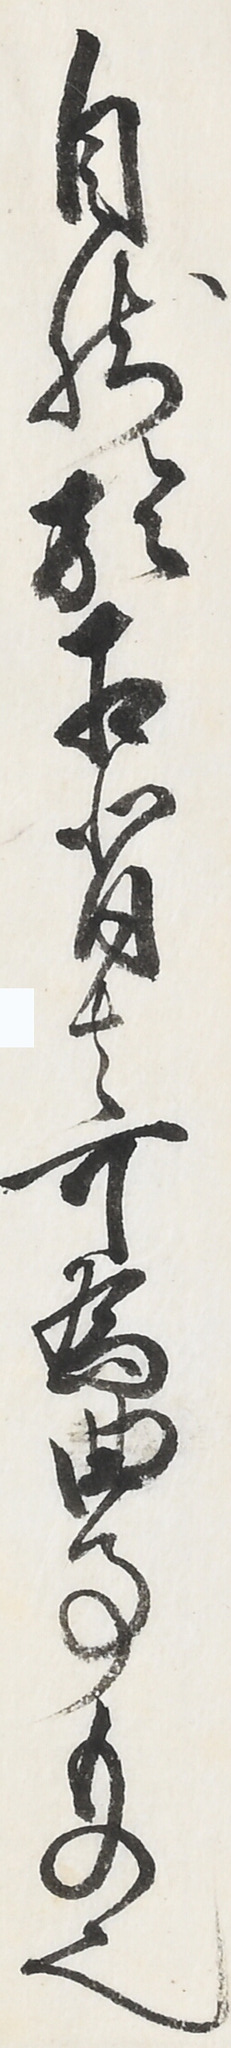自然於相背者可為曲事もの也
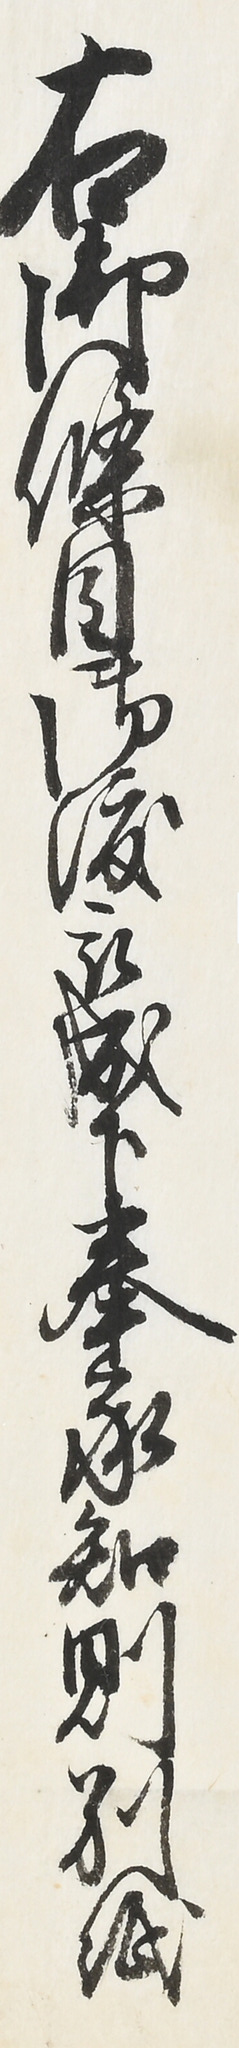右御條目御渡被成下奉承知則別紙
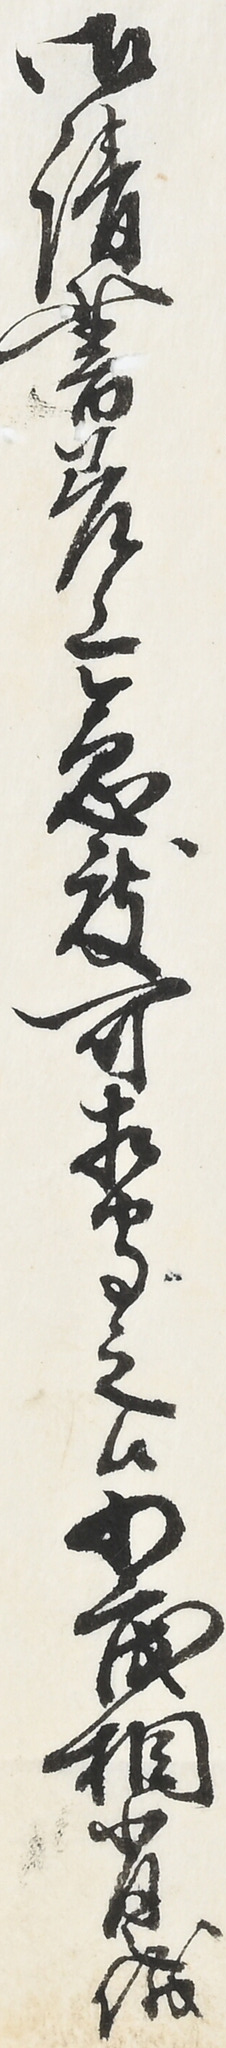請書差上急度可相守之候少茂相背儀

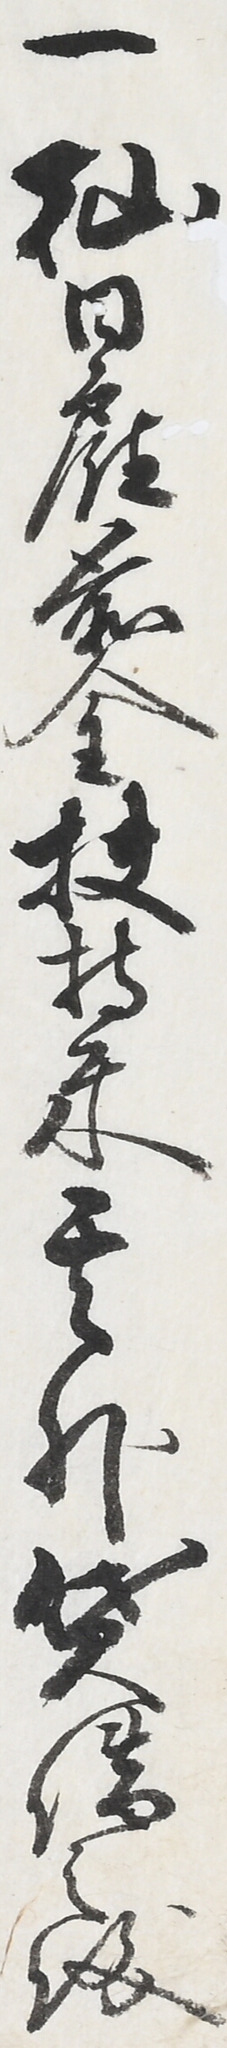一杣日雇前金扶持米其外貸借之儀
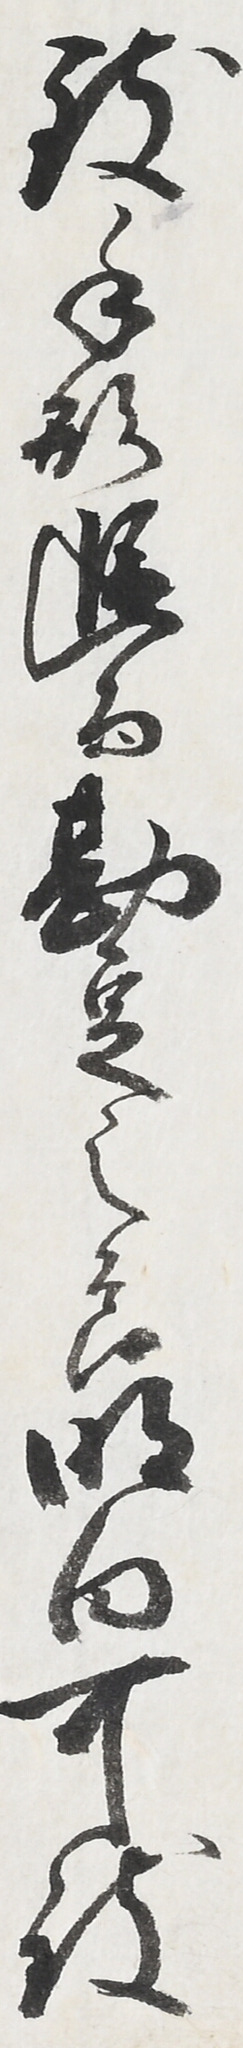致手形追而勘定之節明白可致
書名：小白木條目請書并判取帳
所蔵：伊那市立高遠町図書館・合同会社AMANE
